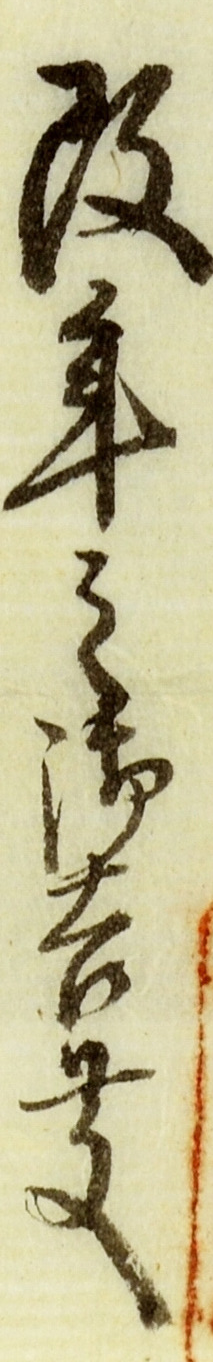改年之御吉慶
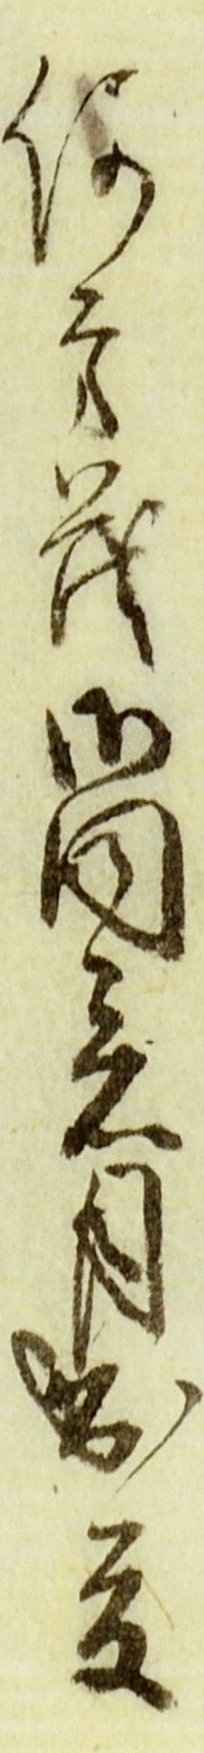何方も御同意目出度
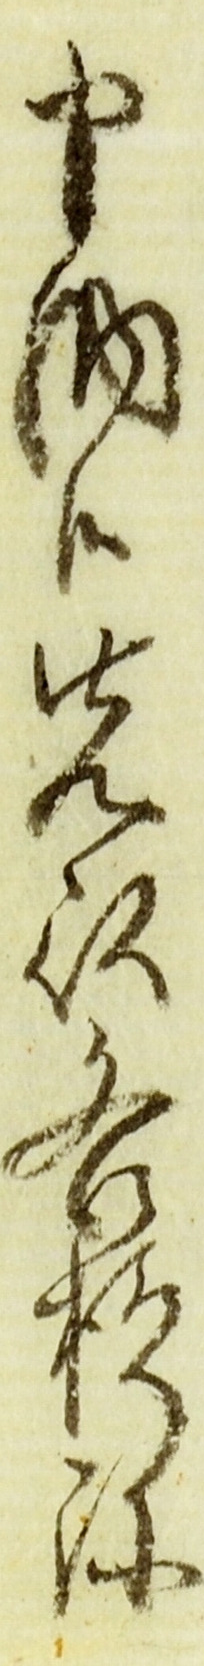申納候先以各様弥
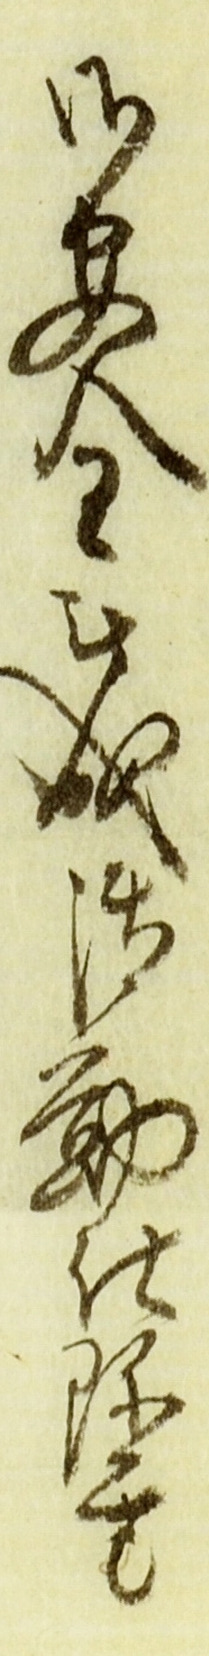御安全被成御勤仕珍重
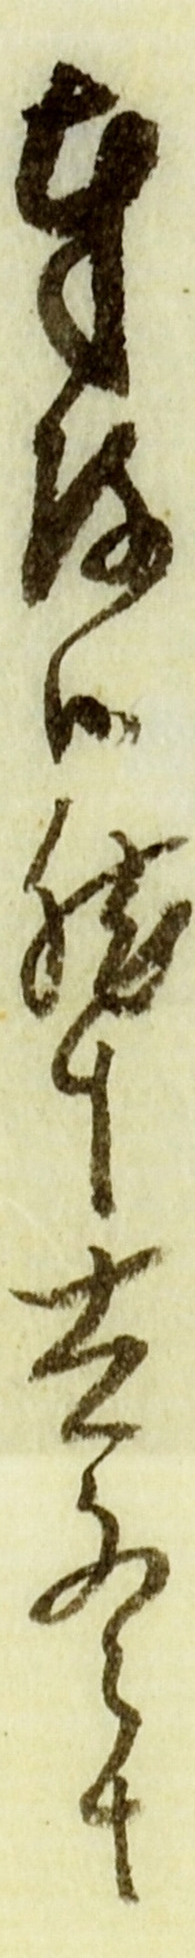奉存候然者去冬中
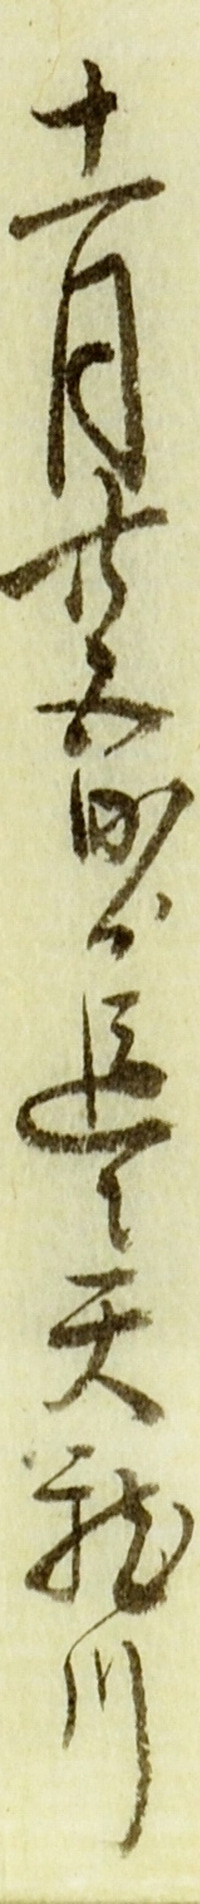十一月廿五日ヨリ追々天龍川
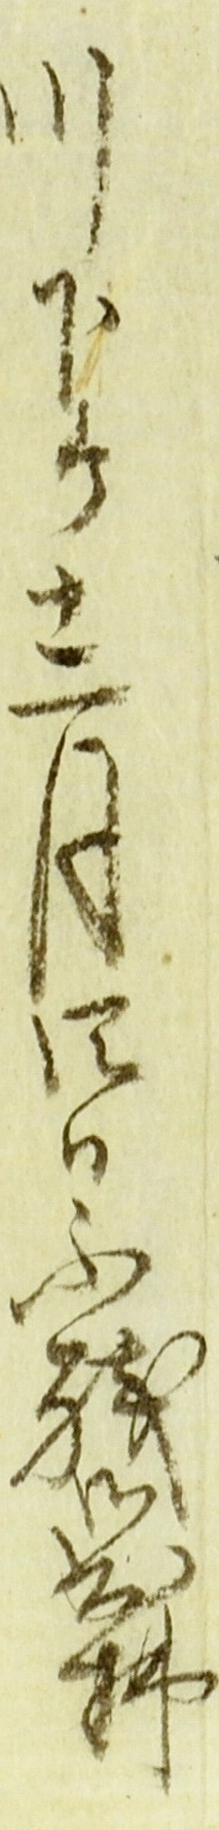川下ケ十二月四日不残御出払
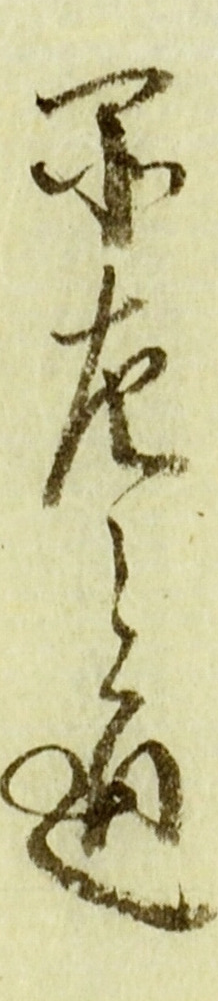品左之通
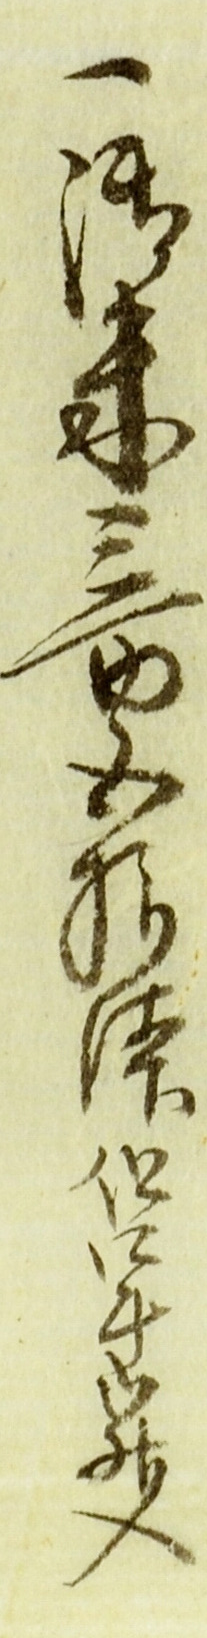一御米三百五拾俵但四斗二升入
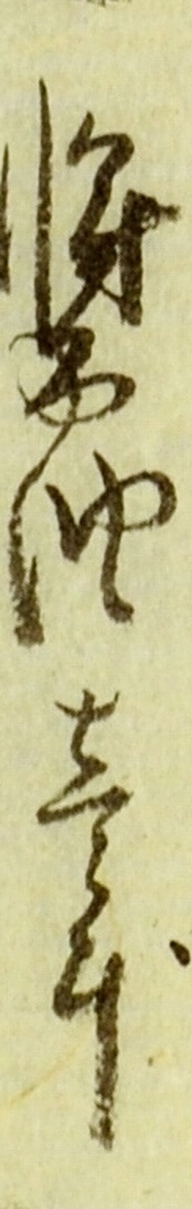一醤油壱本
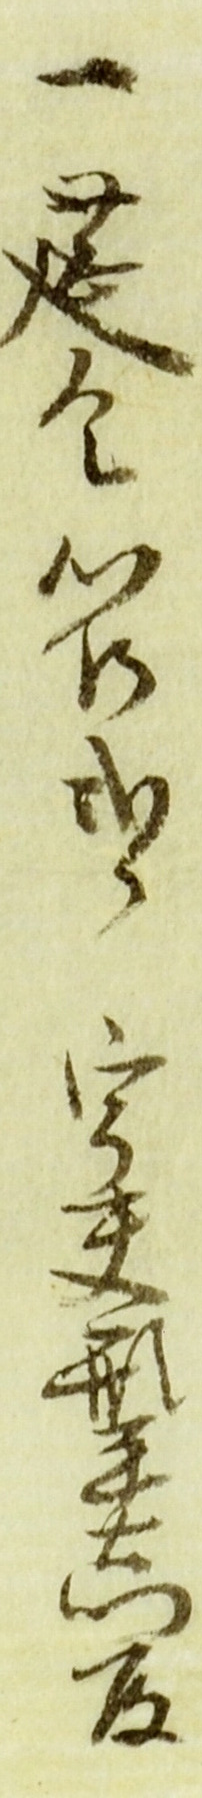一莚之箱弍つ宇夫形平右衛門殿
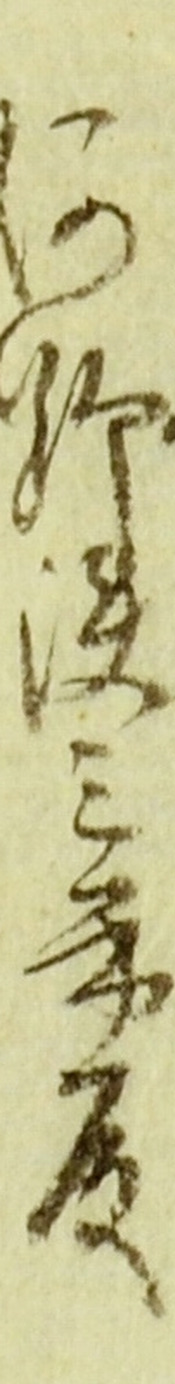河野決三郎殿
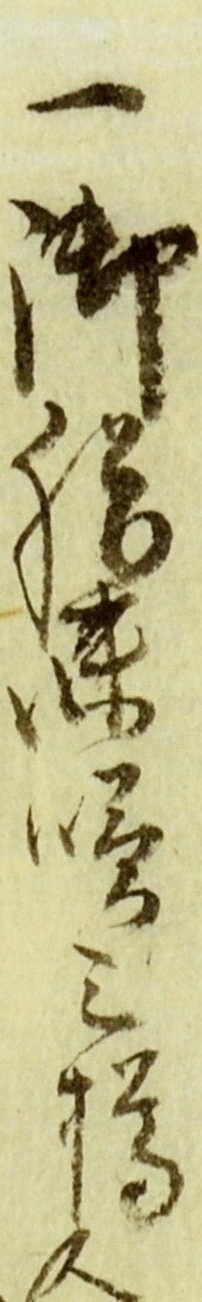一御勝味噌三樽
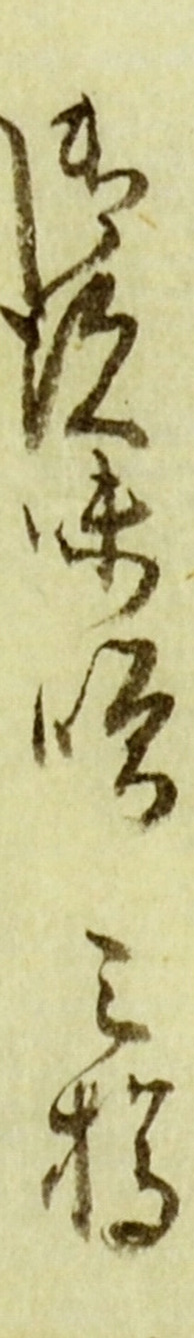一御勝味噌三樽
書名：御廻米通知
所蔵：伊那市立高遠町図書館・合同会社AMANE
